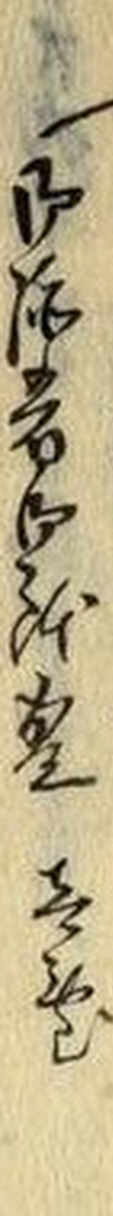御添肴御鉢盛壱台
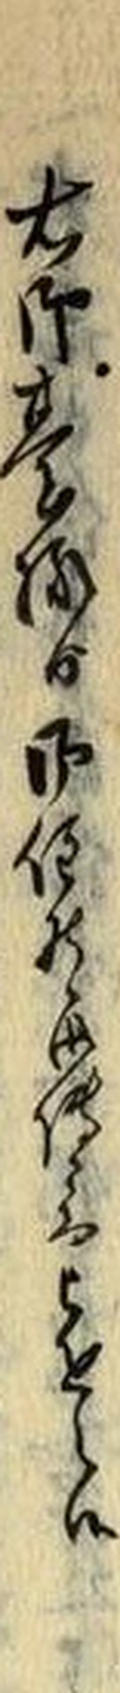右御台様ゟ御住居御伝ニ而被進之候
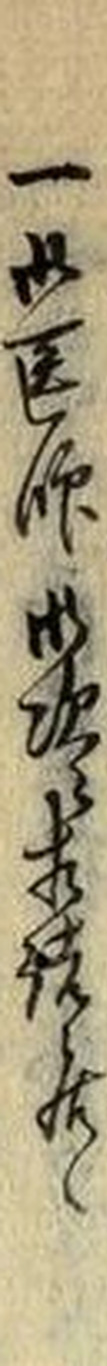一御医師御次ニ相詰居候
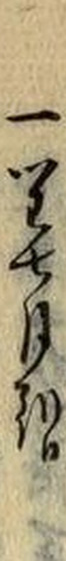一閏七月朔日
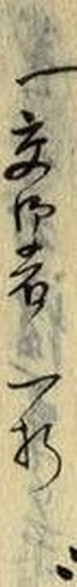交御肴一折
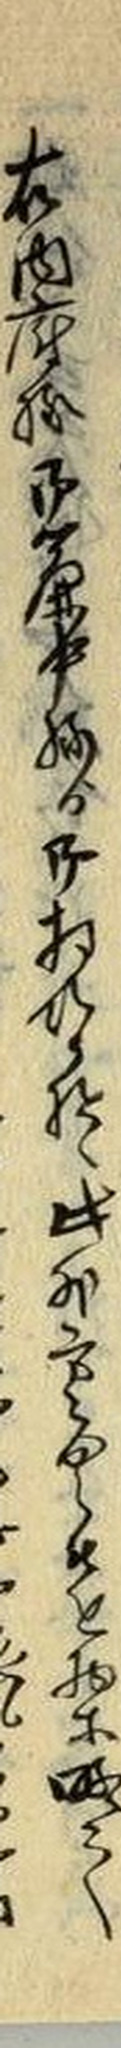右内府様御簾中様ゟ御拝領被遊候此外方々ゟ之被進物等略之
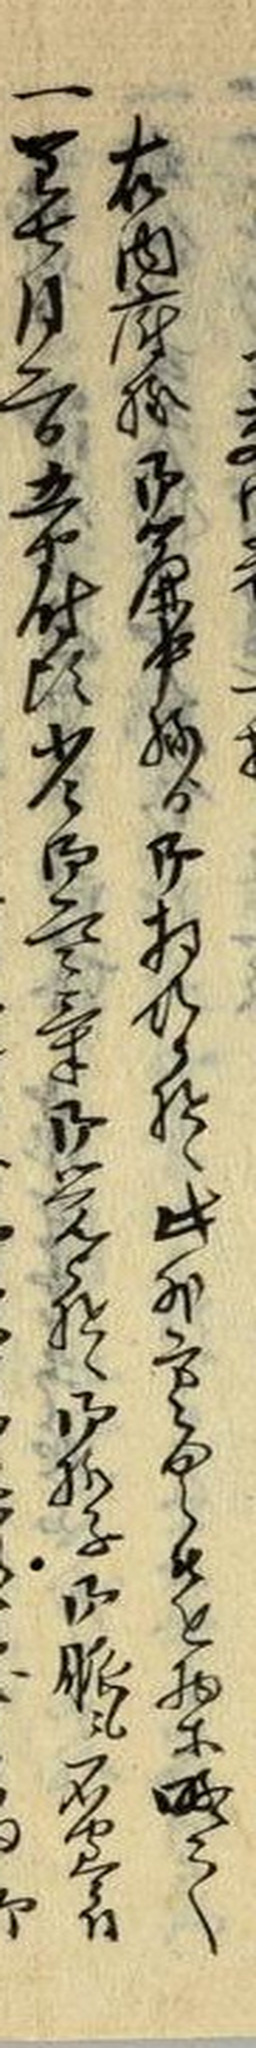一閏七月二日五半時頃少々御寒気御覚被遊候御様子御脈も不宜ニ付
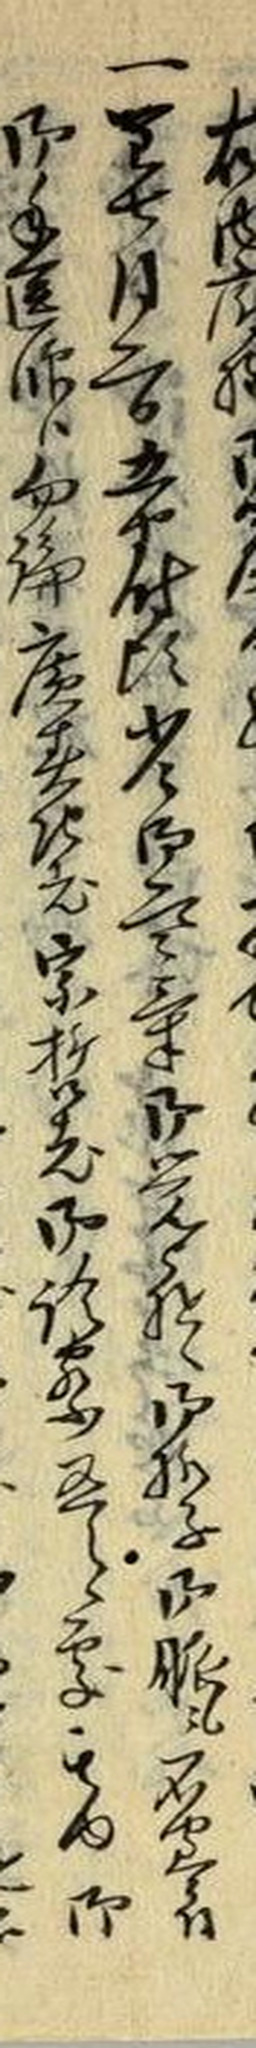御手医師ハ勿論広春院老宗哲老御診察有之候処其内御
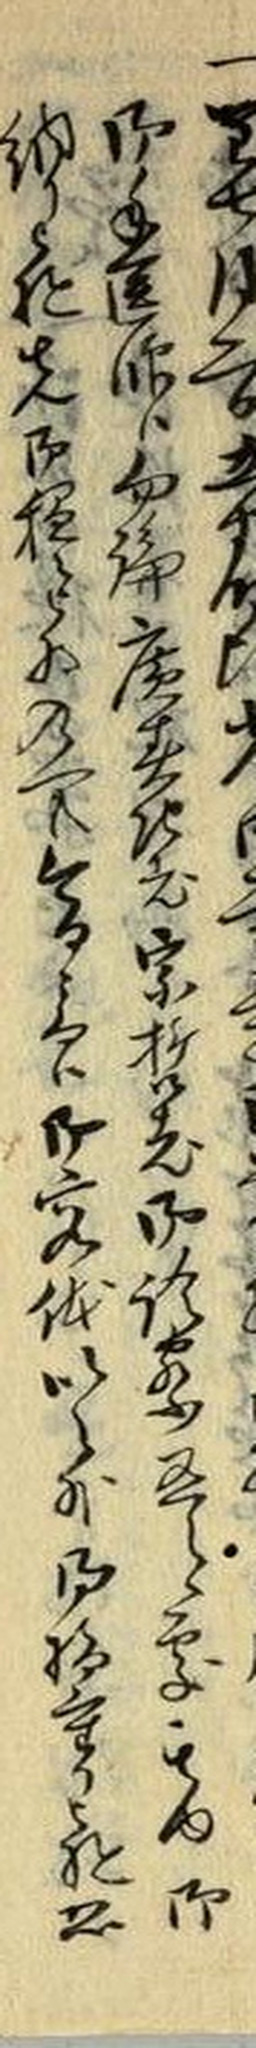納り被遊先御穏ニ被為入候へ共今日ニ而ハ御容体以之外御指重り被遊恐
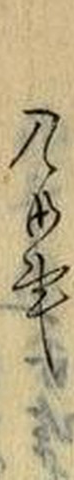入候御事
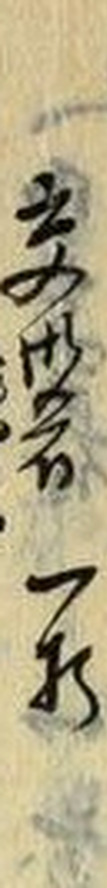交御肴一折
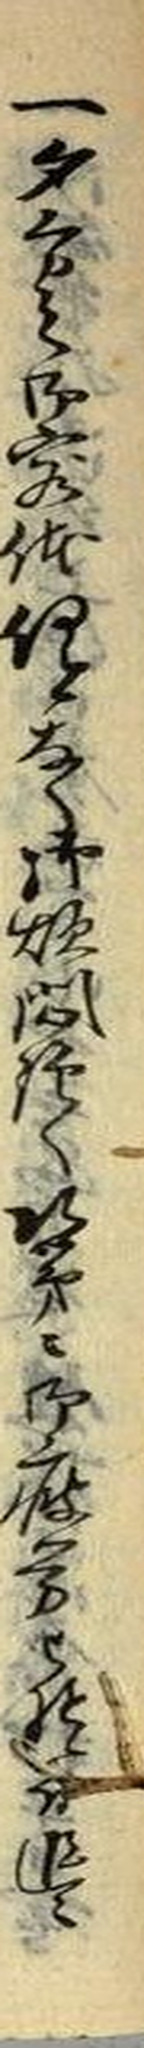一夕方之御容体何となく御煩悶強く次第ニ御疲労被遊候付追々
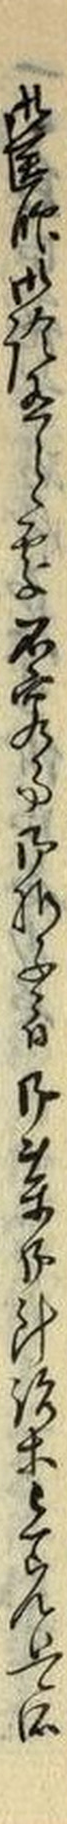御医師御診有之候処不容易御様子ニ付御薬御針治等被差上候所
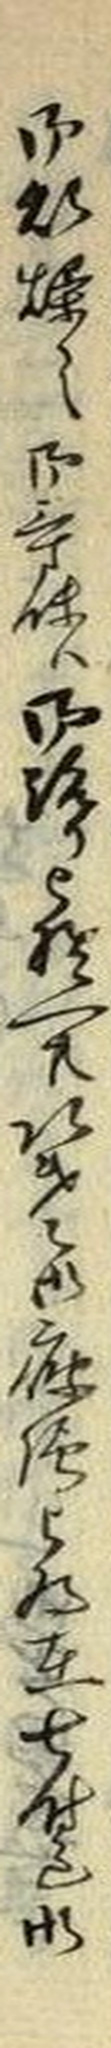御煩燥之御気味ハ御治り被遊候へ共次第ニ御疲強被為在七時過御
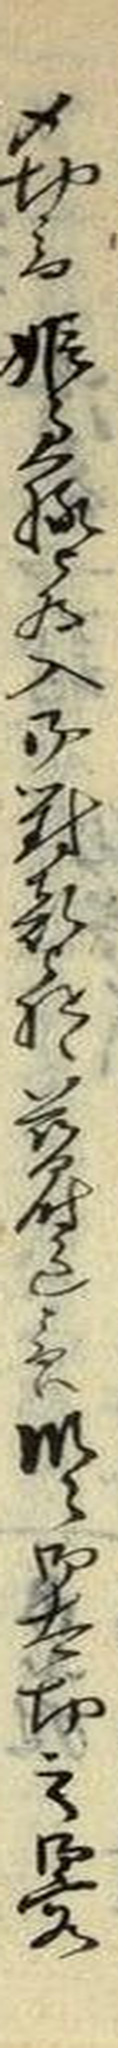〆切ニ而姫君様被為入御対顔被遊候暮時過ニ而ハ段々御大切之御容
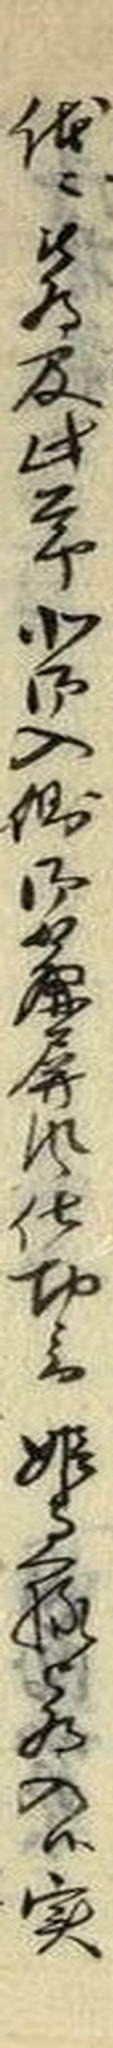体ニ被為及此節北御入側御簾屏風仕切ニ而姫君様被為入候実
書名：少傅日録抄（斉承付側向頭取日記、在府）
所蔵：福井県文書館 Fukui Prefectural Archives
